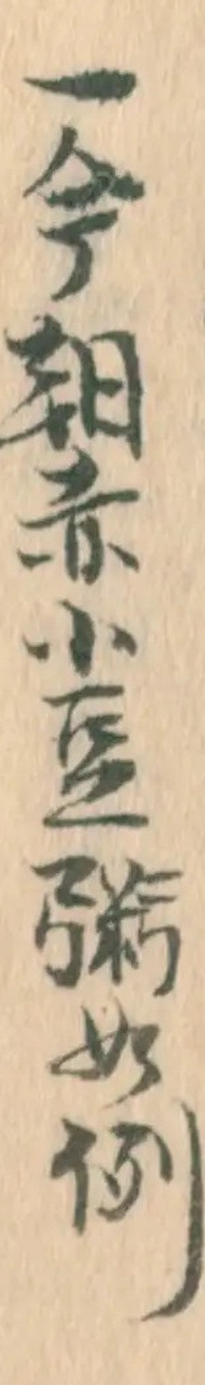一今朝赤小豆粥如例
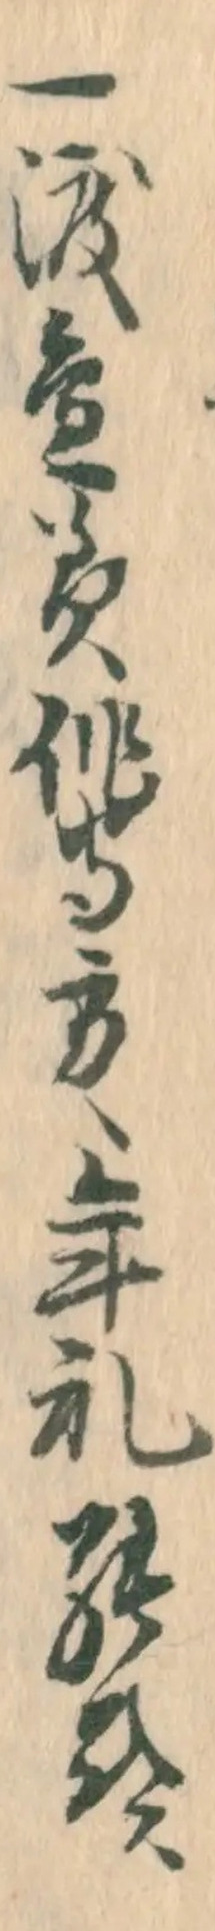一渡辺美作守方へ年礼罷越ス
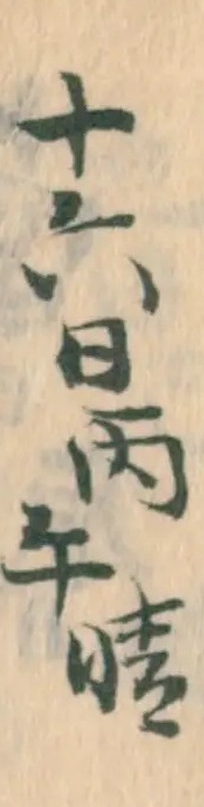十六日丙午晴
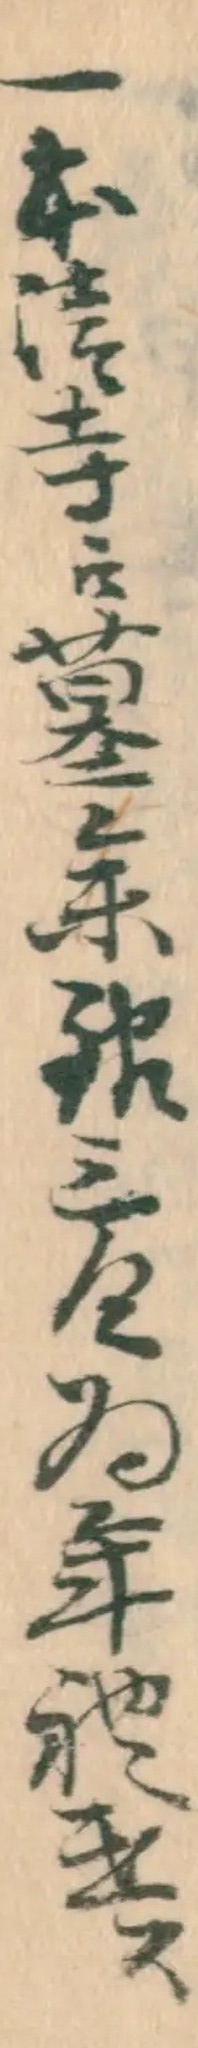一本清寺え墓参銀三匁為年礼遣ス
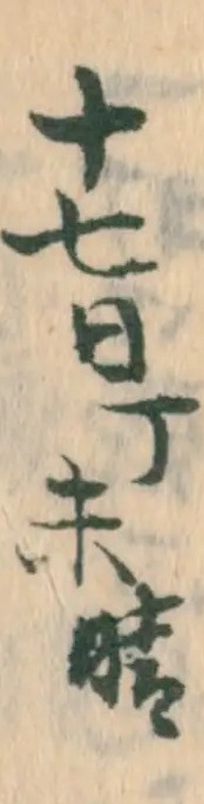十七日丁未晴
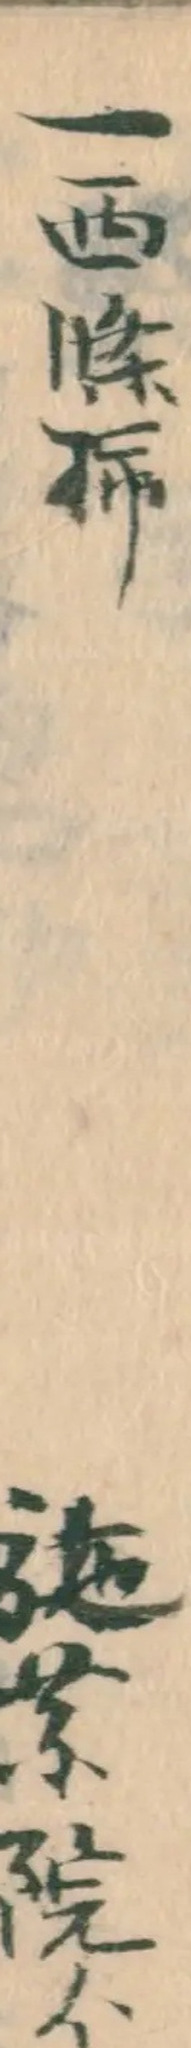一西条柿施薬院ゟ
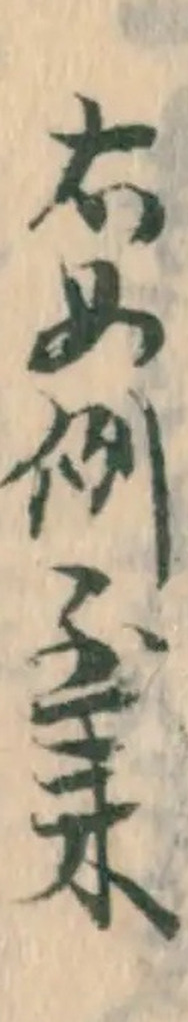右如例到来
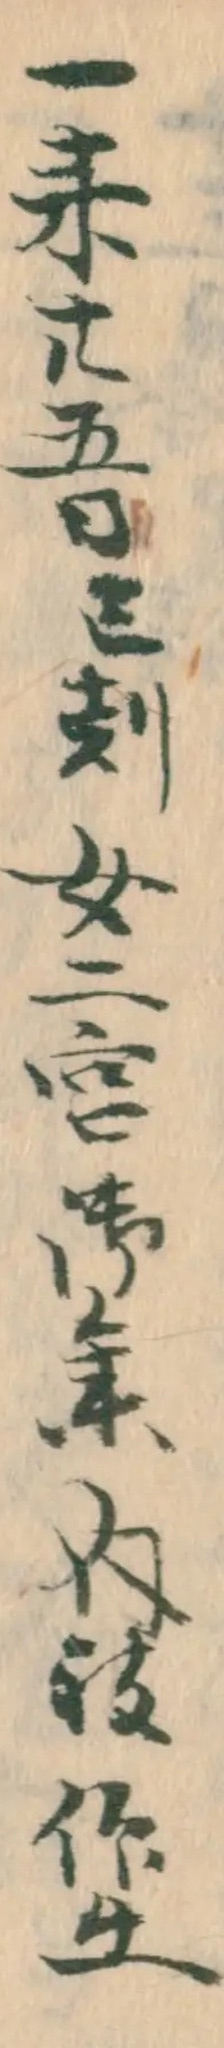一来廿五日巳刻女二宮御参内被仰出
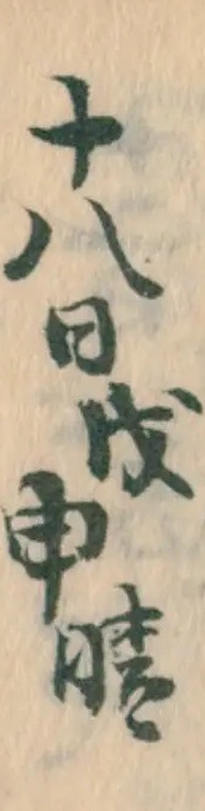十八日戊申晴
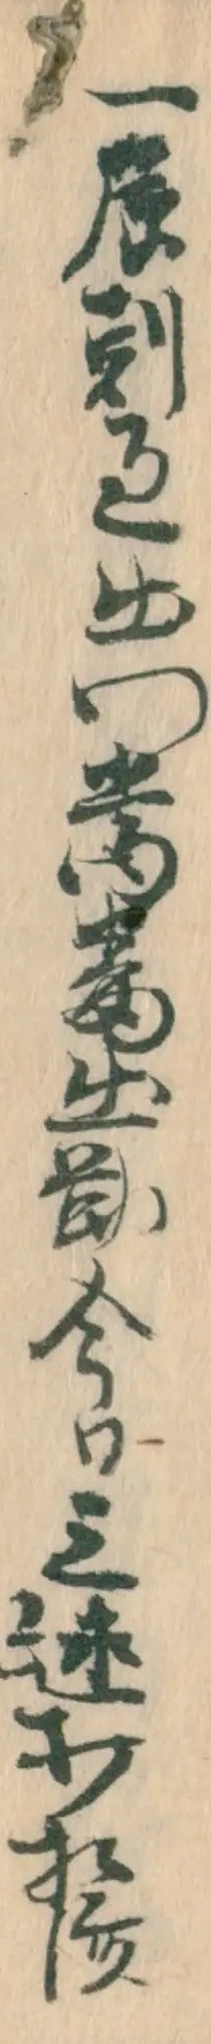一辰刻過出門当番出勤今日三毬打相済

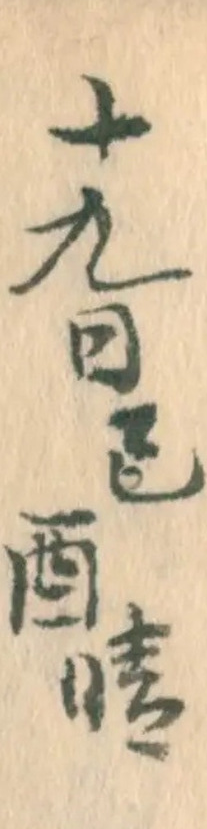十九日己酉晴
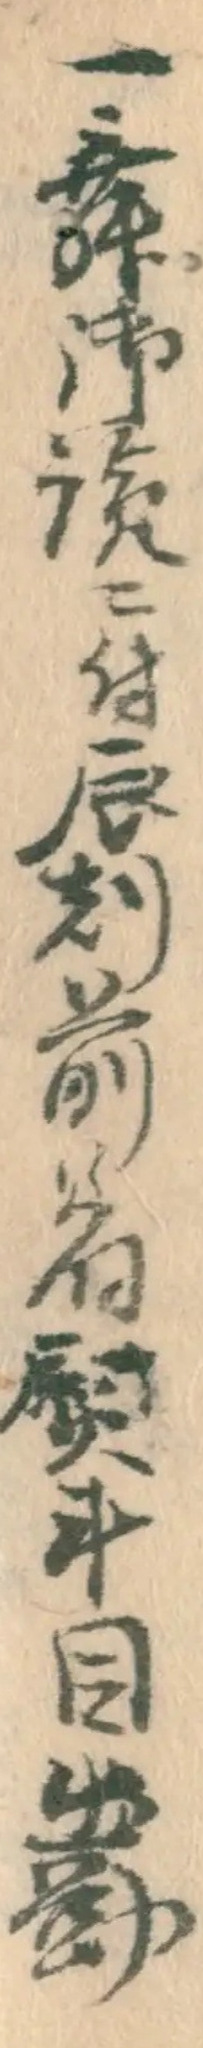一舞御覧ニ付辰刻前着熨斗目出勤
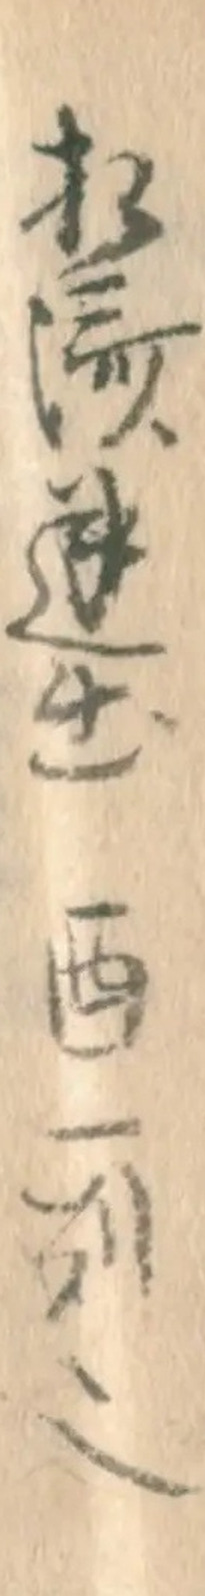相済退出酉一刻也
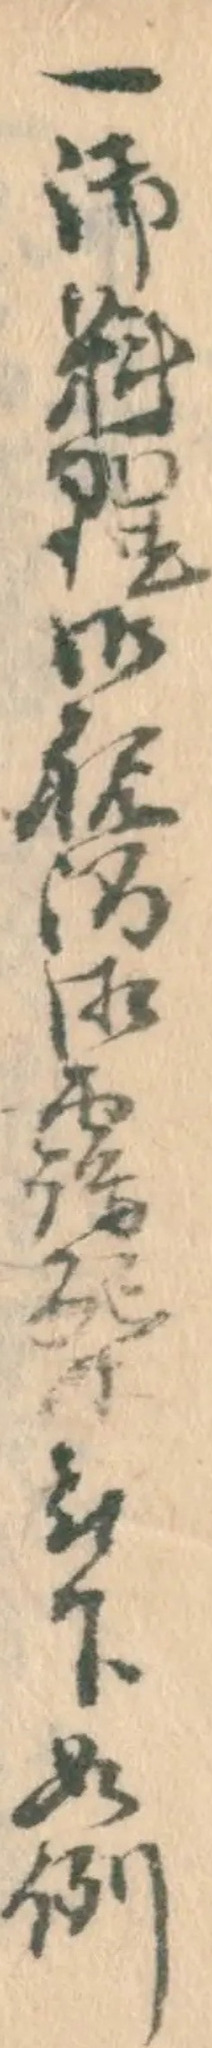一御料理御祝酒御鶴配等被下如例
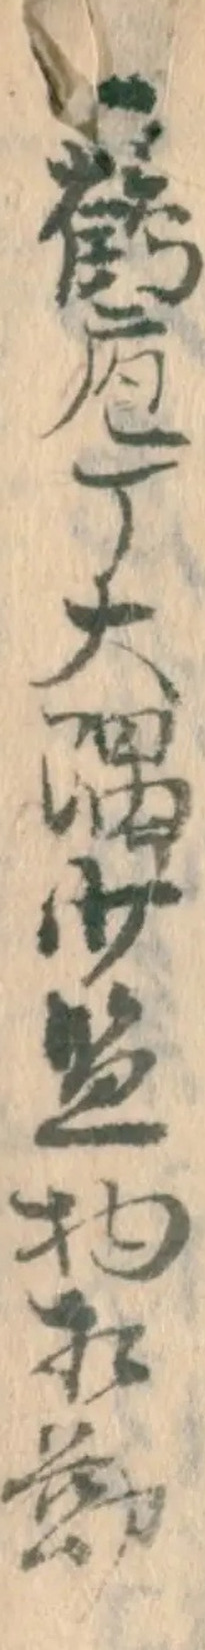一鶴包丁大隅少監物相勤
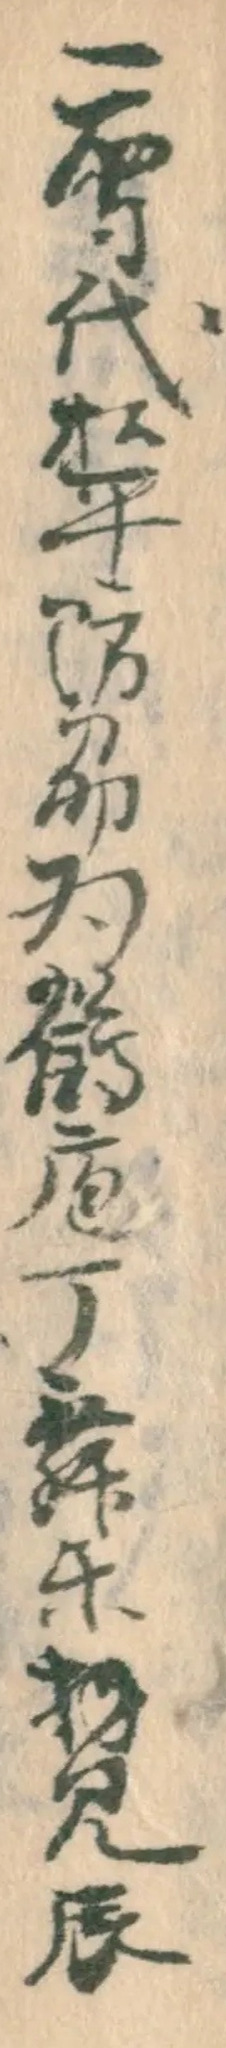一所司代松平防州為鶴包丁舞楽拝見辰
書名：禁裏御所御用日記. [131]
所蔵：国立国会図書館 National Diet Library, JAPAN
